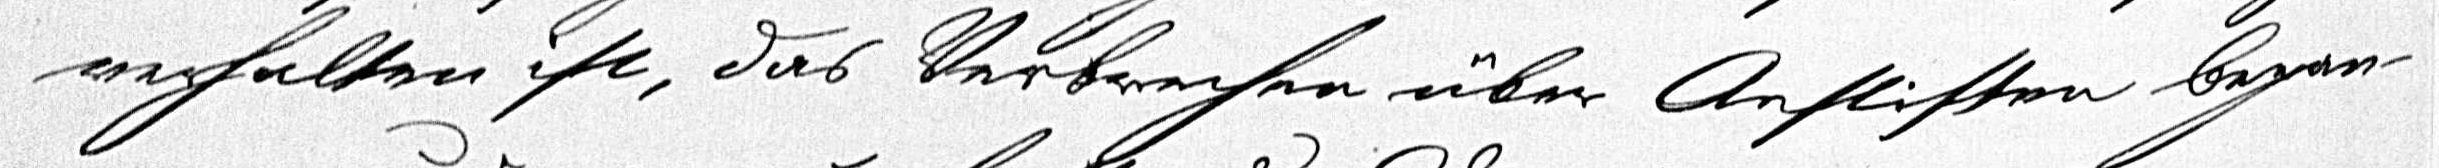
verhalten ist, das Verbrechen über Anstiften began¬
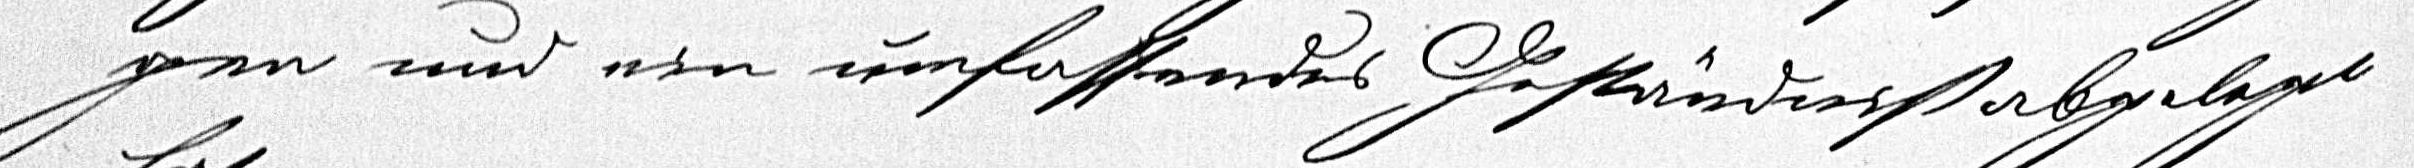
gen und ein umfassendes Geständniß abgelegt
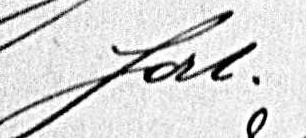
hat.
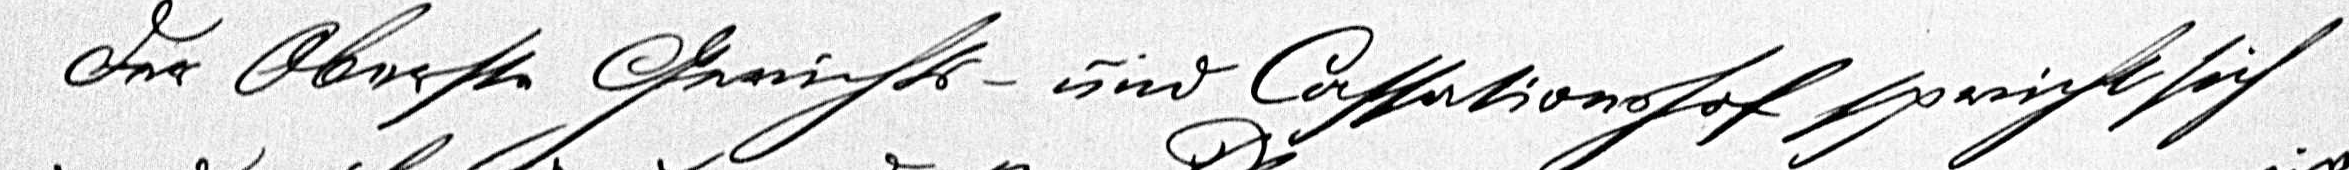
Der Oberste Gerichts- und Cassationshof spricht sich
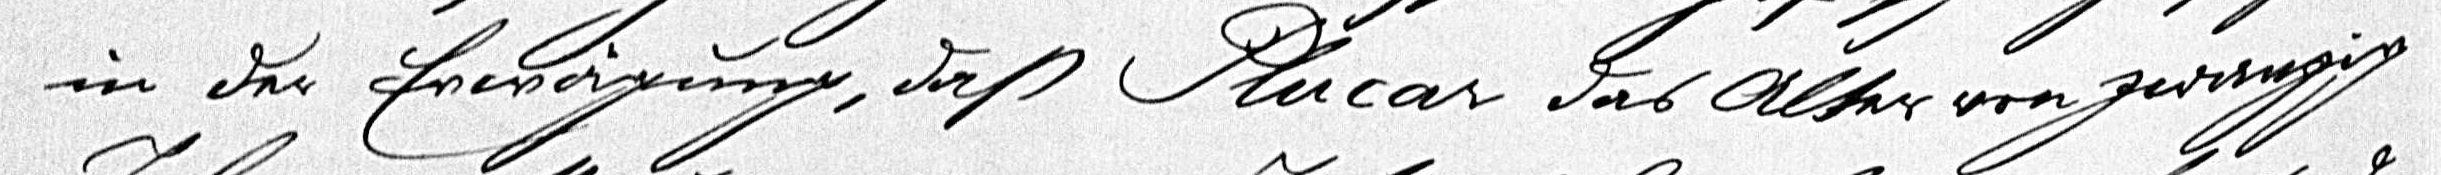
in der Erwägung, daß Plucar das Alter von zwanzig
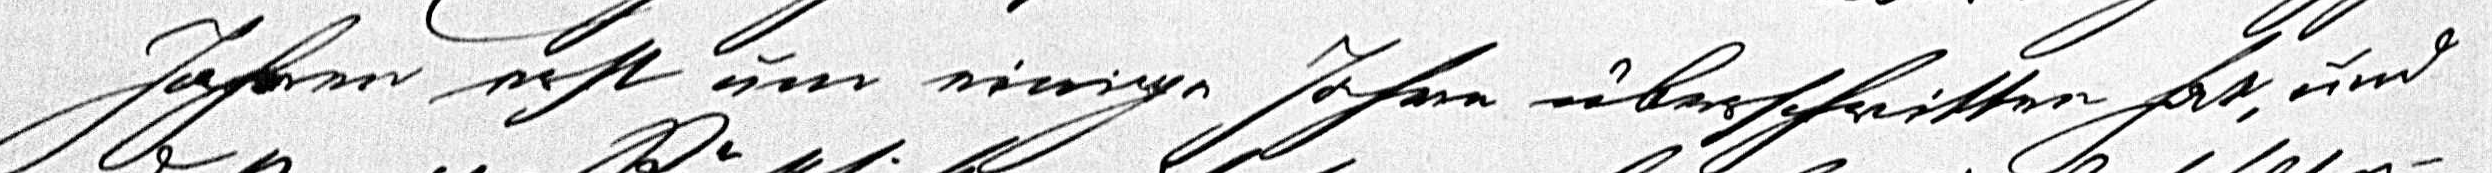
Jahren erst um einige Jahre überschritten hat, und
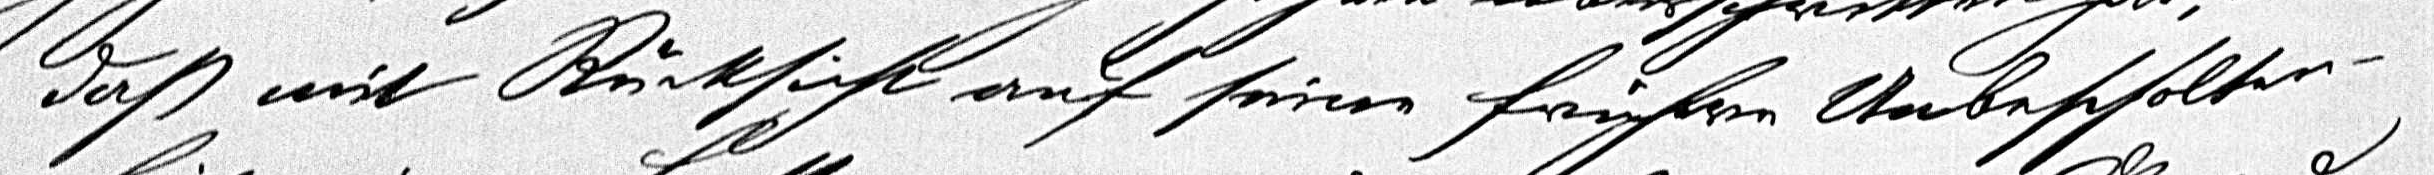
daß mit Rücksicht auf seine frühre Unbescholten¬
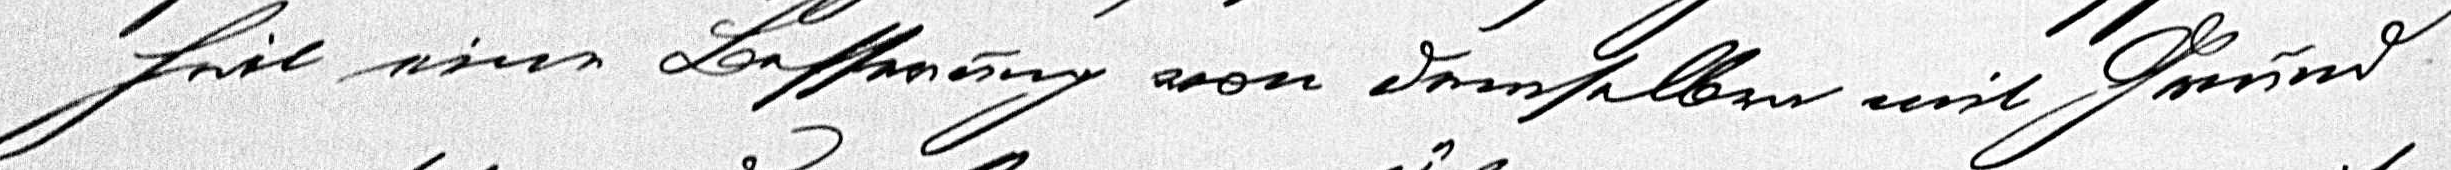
heit eine Besserung von demselben mit Grund
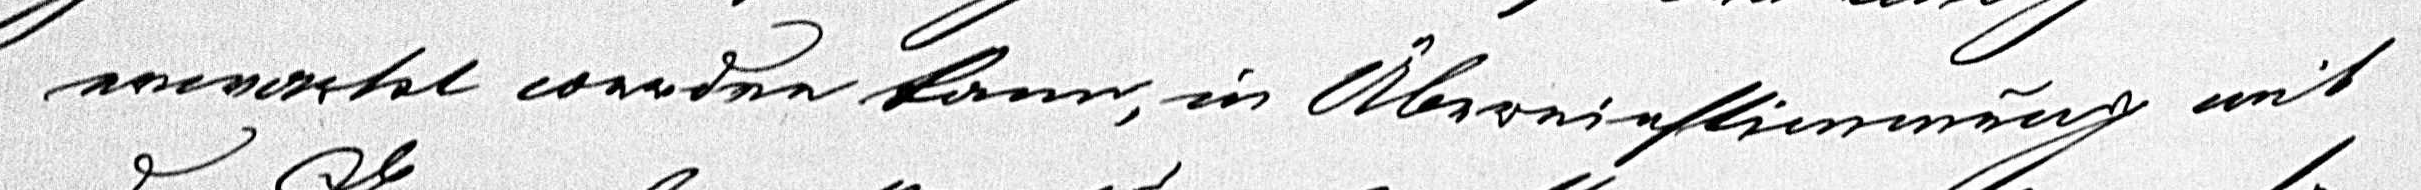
erwortet werden kann, in Übereinstimmung mit
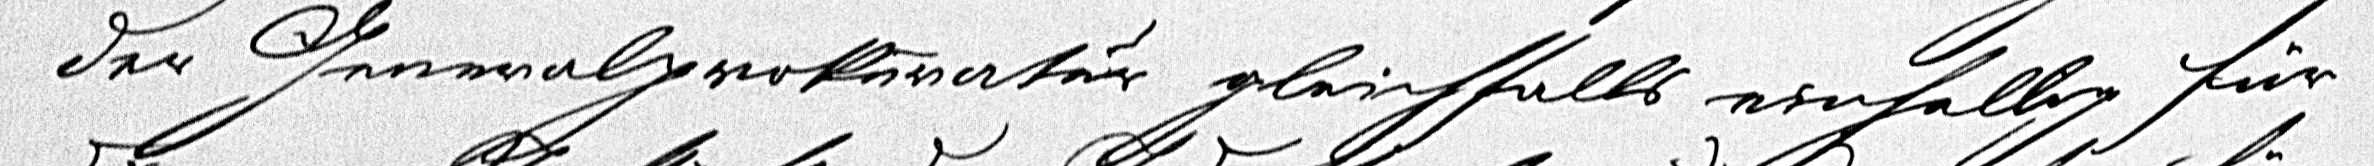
der Generalprokuratur gleichfalls einhellig für
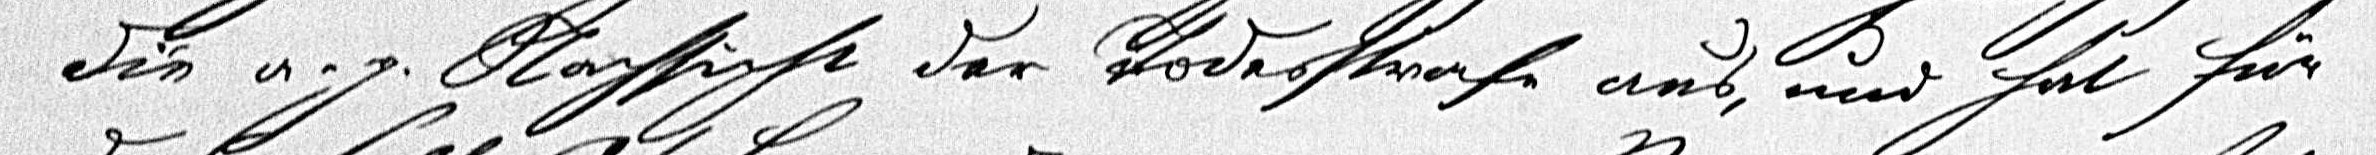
die a. g. Nachsicht der Todesstrafe aus, und hat für
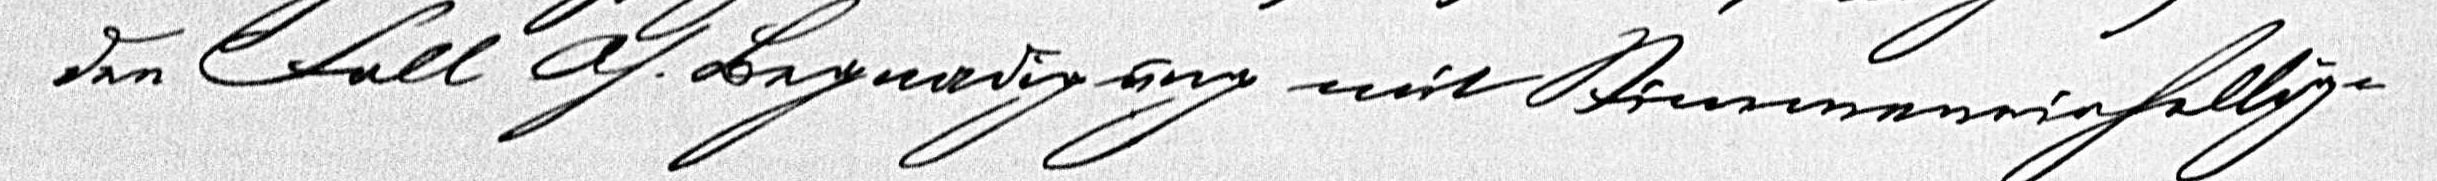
den Fall Ah. Begnadigung mit Stimmeneinhellig¬
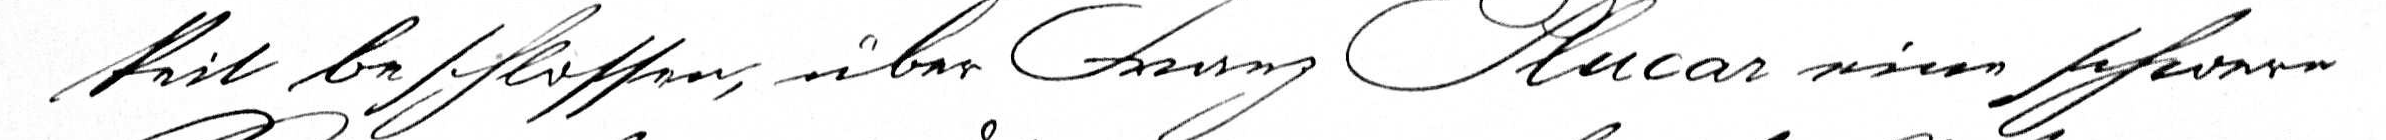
keit beschlossen, über Franz Plucar eine schwere
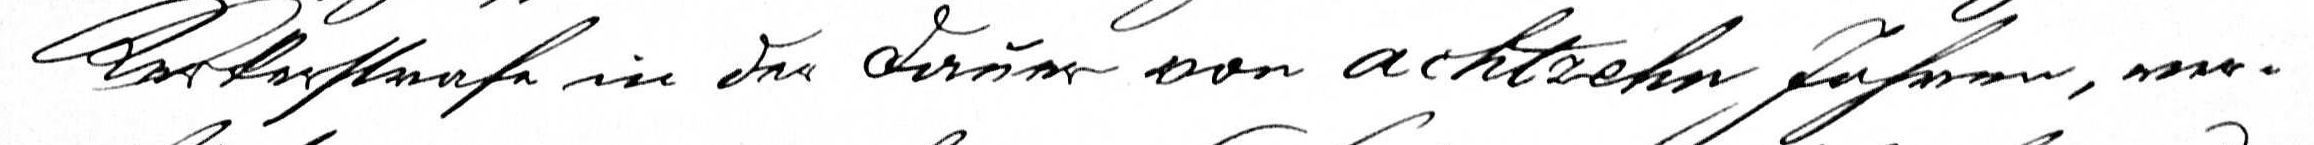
Kerkerstrafe in der Dauer von achtzehn Jahren, ver¬
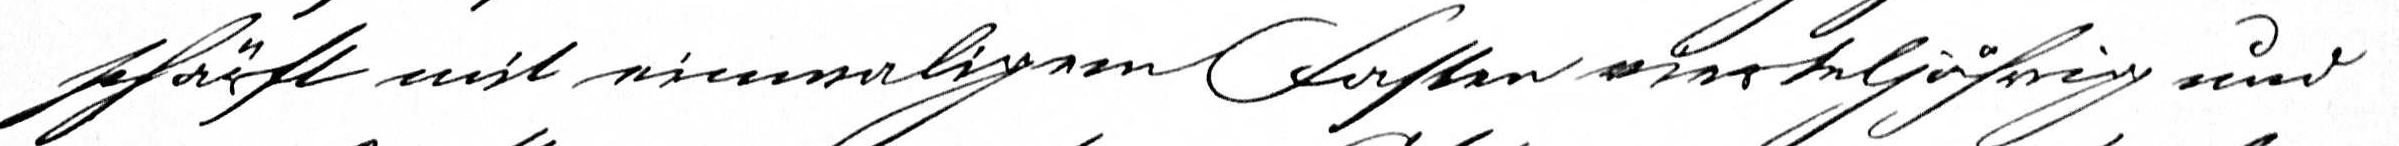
schärft mit einmaligem Fasten vierteljährig und
